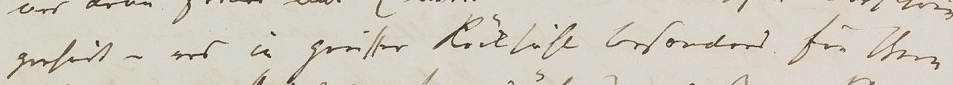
genheit – was in gewisser Rücksicht besonders für Bern
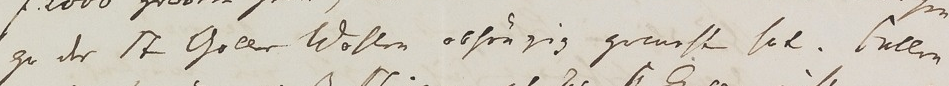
ge der St. Galler Wahlen abhängig gemacht hat. Fallen
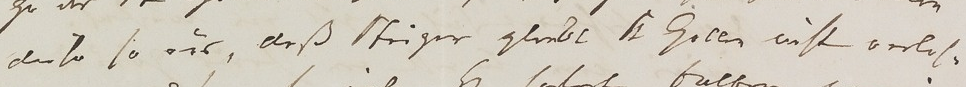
diese so aus, daß Steiger glaubt St Gallen nicht verlas-
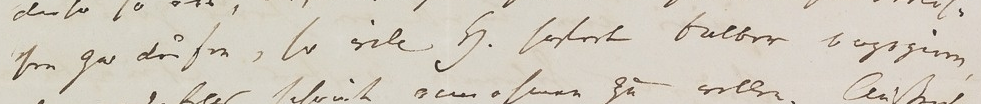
sen zu dürfen, so willH. sofort Felber engagiren,
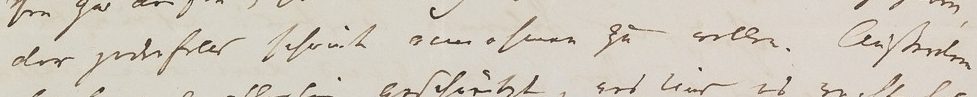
der jedenfalls scheint annehmen zu wollen. Außerdem
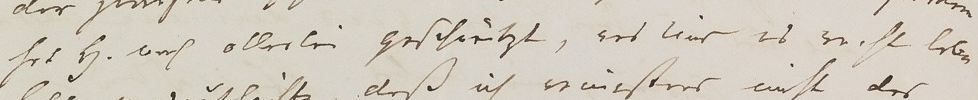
hat H. noch allerlei geschwätzt, was mir es recht leb-
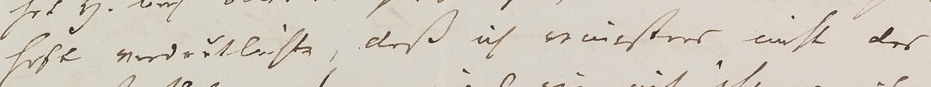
haft verdeutlichte, daß ich wenigstens nicht das
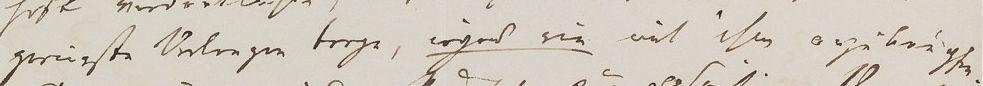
geringste Verlangen trage, irgend wie mit ihm anzuknüpfen.
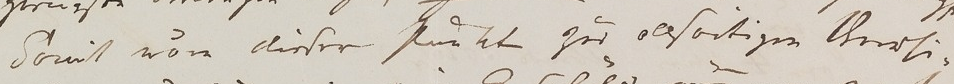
Somit wäre dieser Punkt zur allseitigen Beruhi-
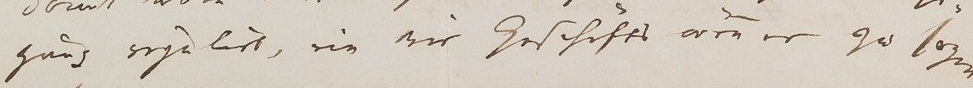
gung regulirt, wie wir Geschäftsmänner es zu sagen
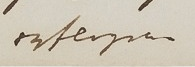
pflegen.
